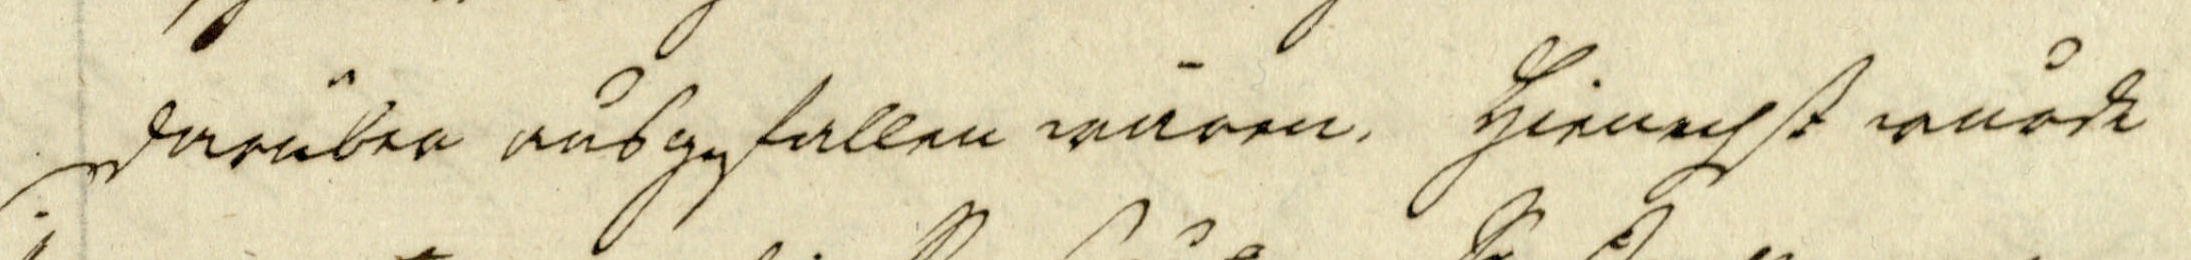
darüber ausgefallen wären. Hienechst wurde
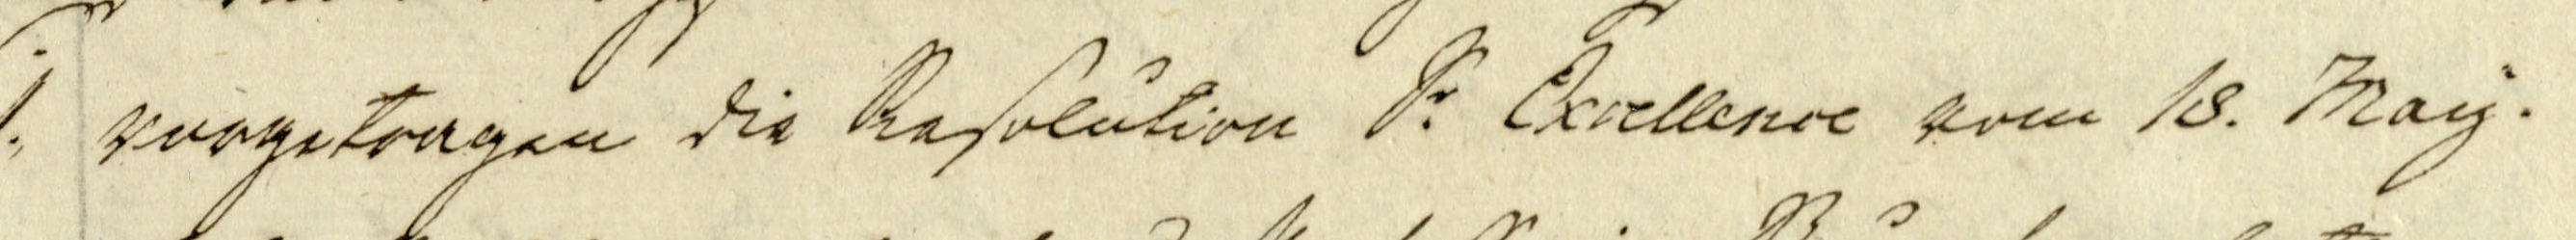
1. vorgetragen die Resolution Sr. Excellence vom 18. Maÿ
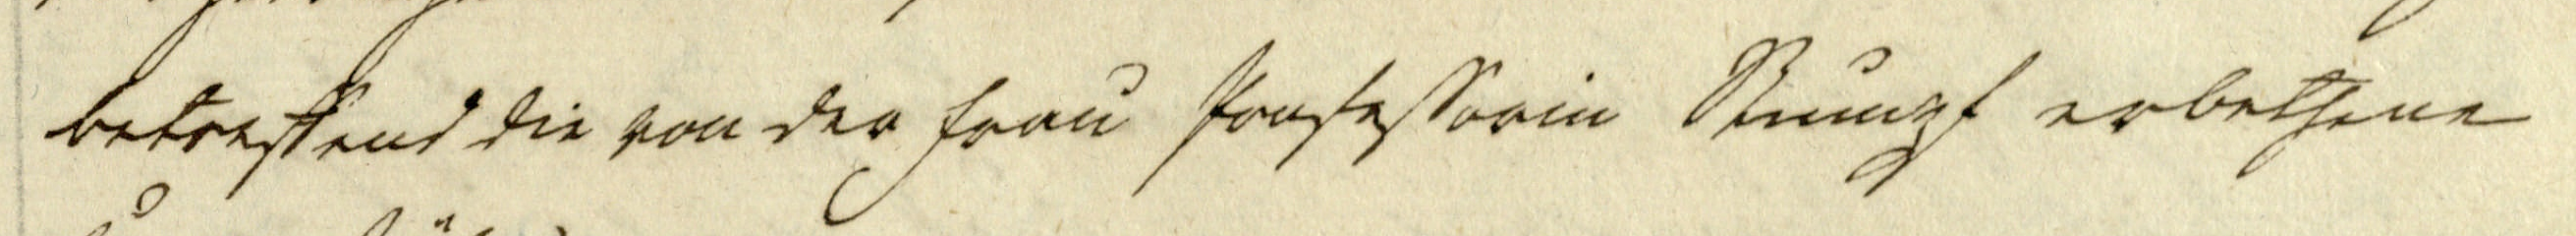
betreffend die von der Frau Professorin Stumpf erbethene
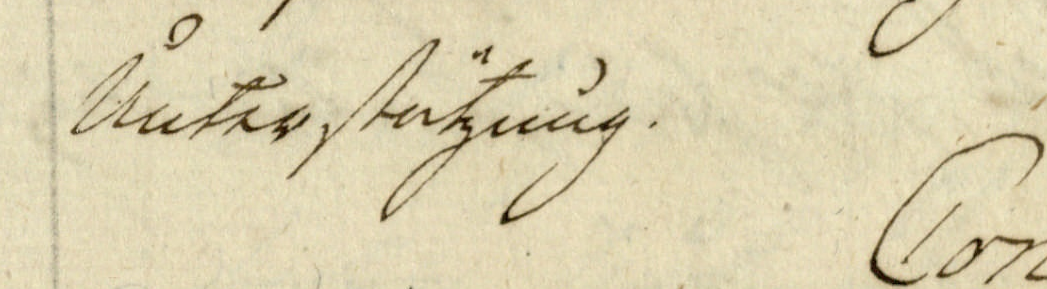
Unterstützung.
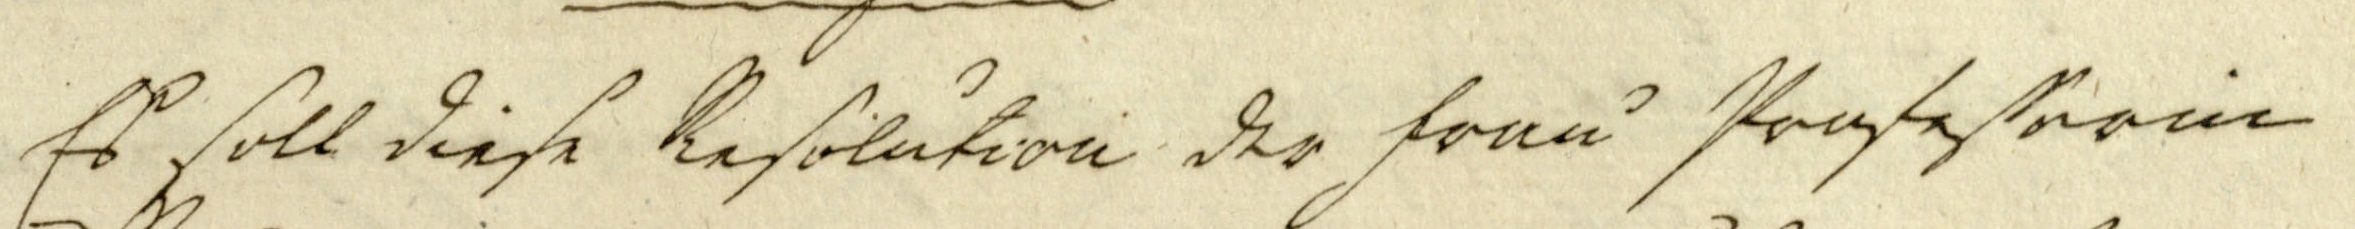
Es soll diese Resolution der Frau Professorin
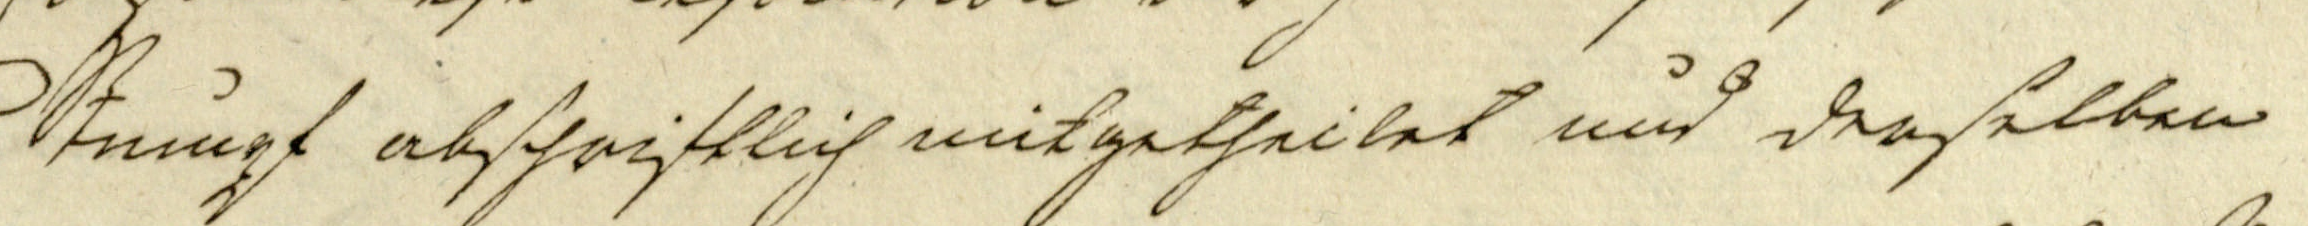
Stumpf abschriftlich mitgetheilet und derselben
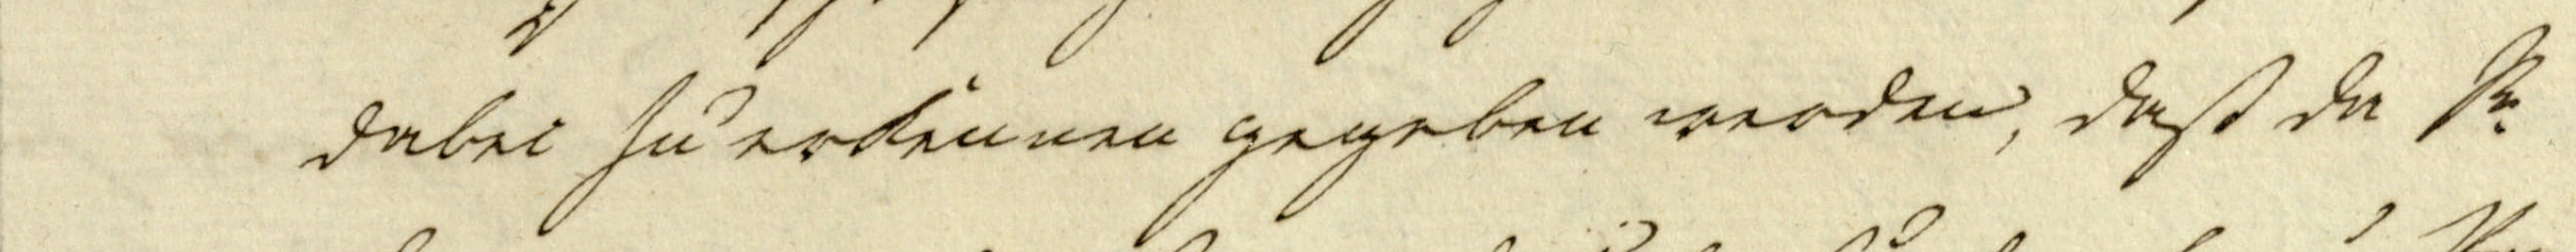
dabei zu erkennen gegeben werden, daß da Sr.
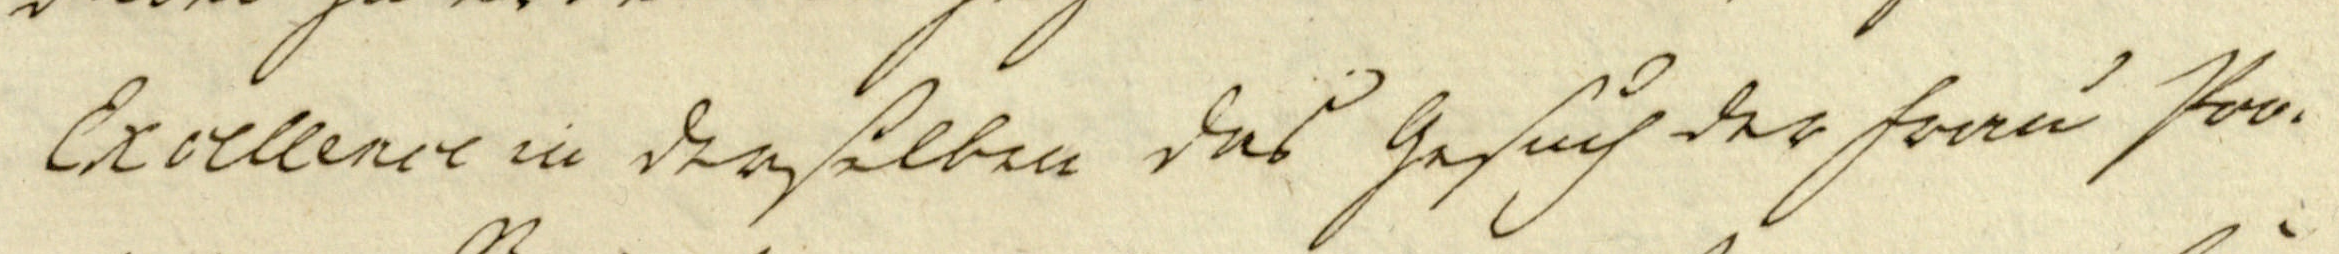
Excellence in derselben das Gesuch der Frau Pro¬
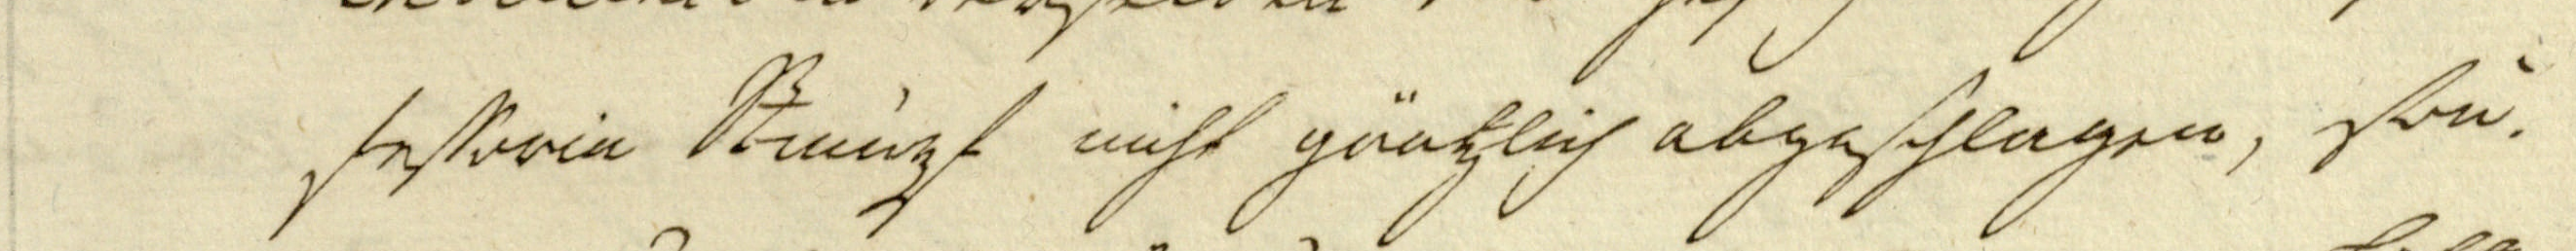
fessorin Stumpf nicht gäntzlich abgeschlagen, son¬
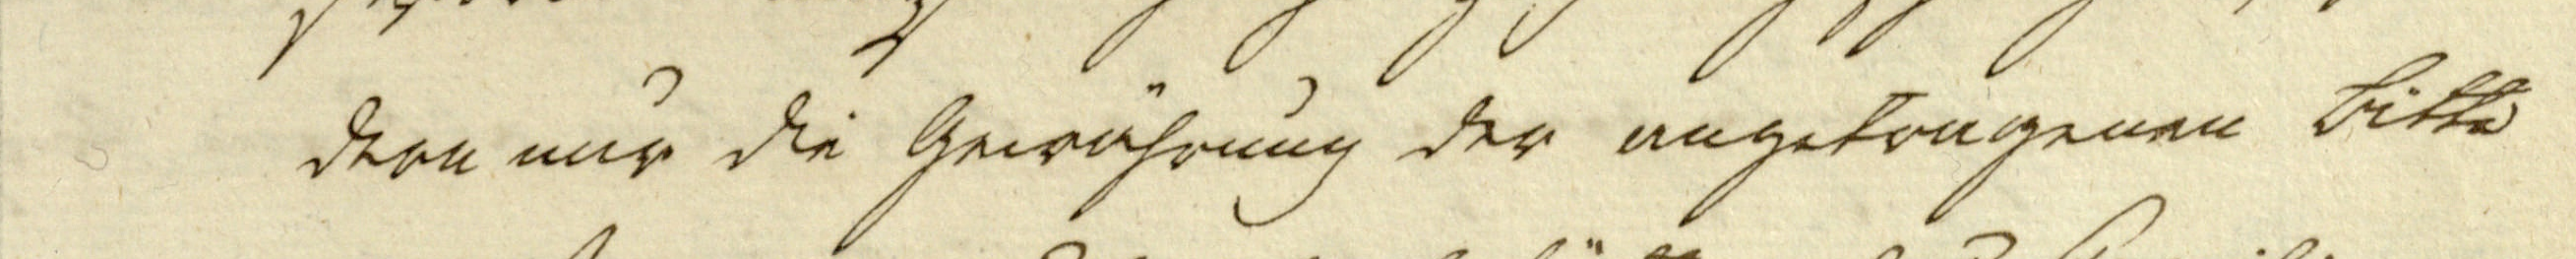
dern nur die Gewährung der angetragenen Bitte
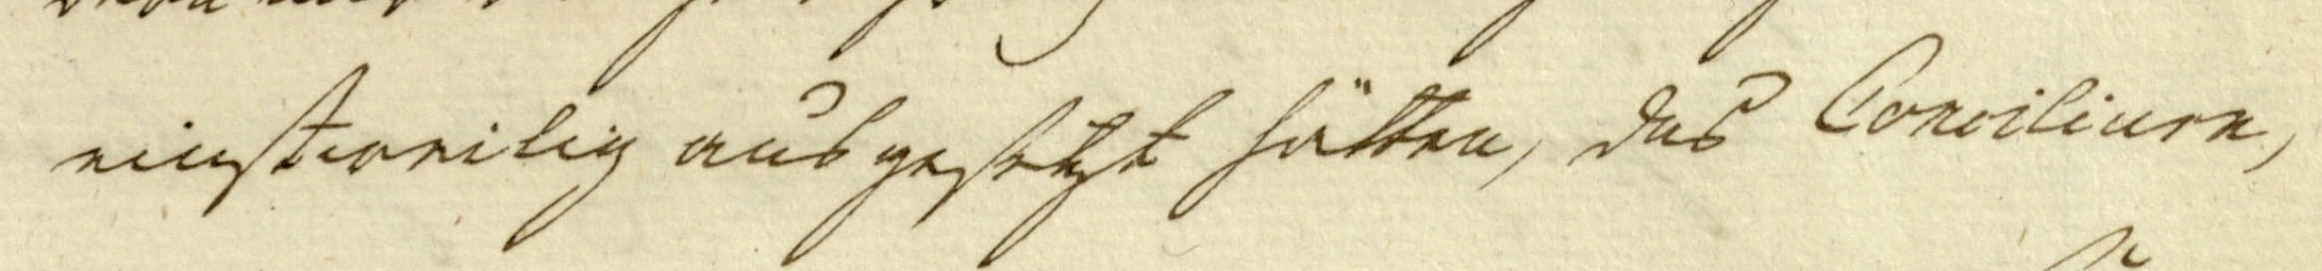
einstweilig ausgesetzt hätten, das Concilium
